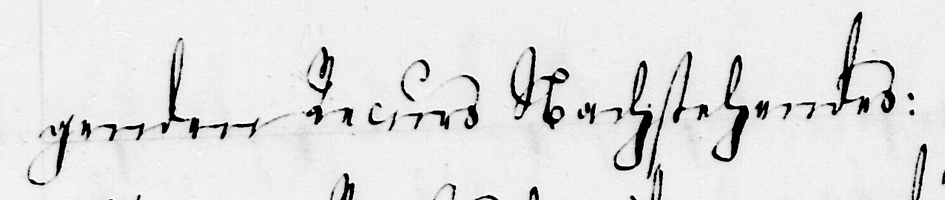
genden Recurs Nachstehendes:
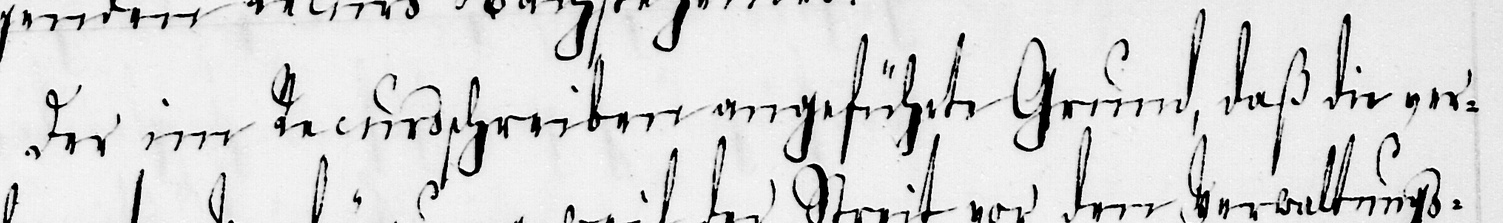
Der im Recursschreiben angeführte Grund, daß die ver¬
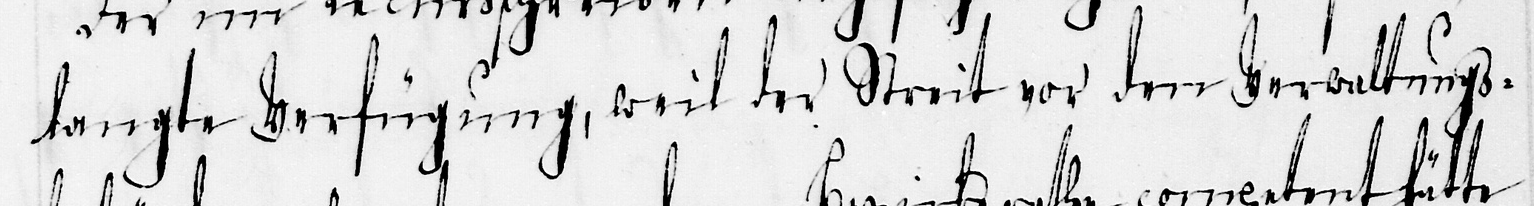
langte Verfügung, weil der Streit vor den Verwaltungs¬
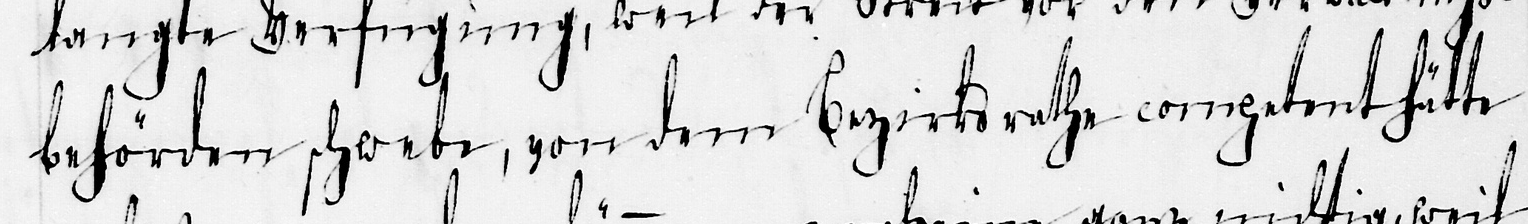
behörden schwebe, von dem Bezirksrathe competent hätte
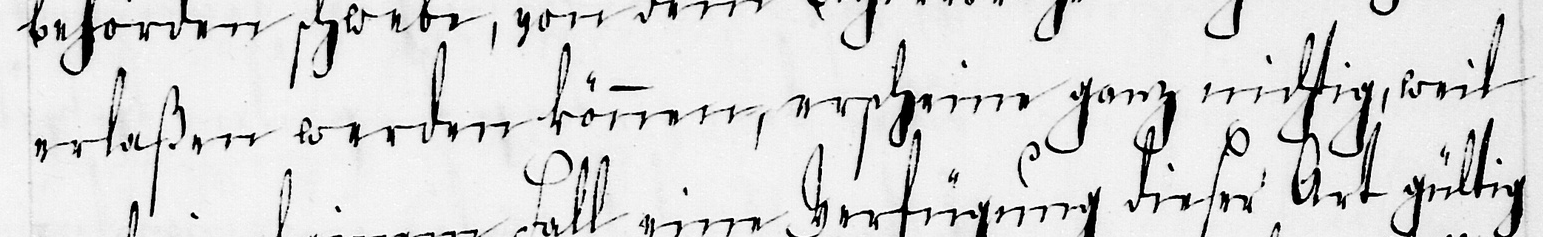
erlaßen werden können, erscheine ganz nichtig, weil
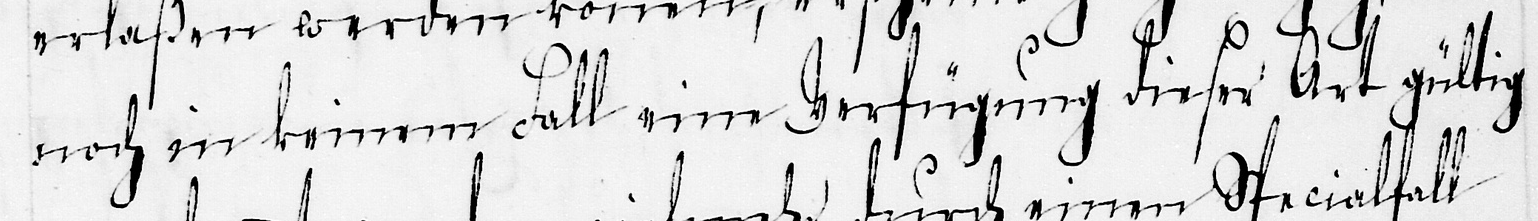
noch in keinem Fall eine Verfügung dieser Art gültig
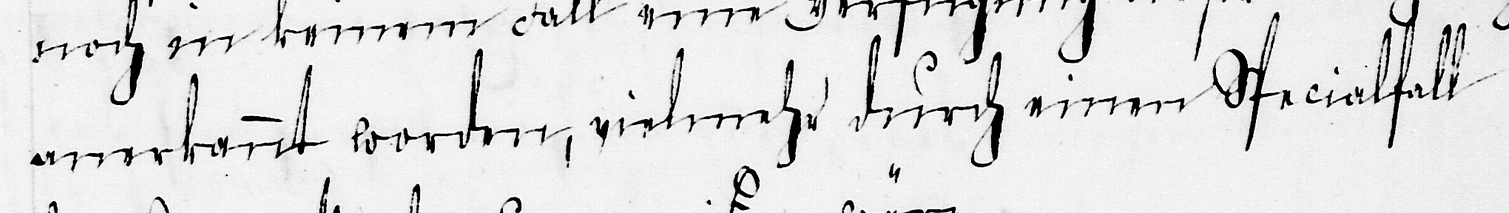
anerkannt worden, vielmehr durch einen Specialfall
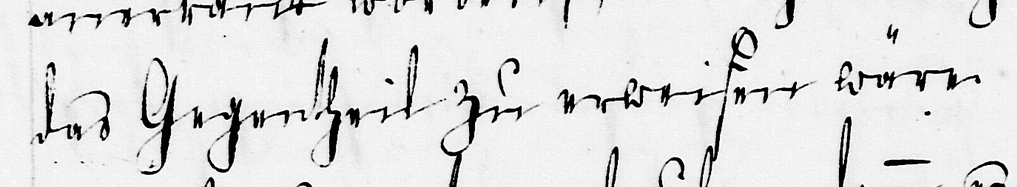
das Gegentheil zu erweisen wäre.
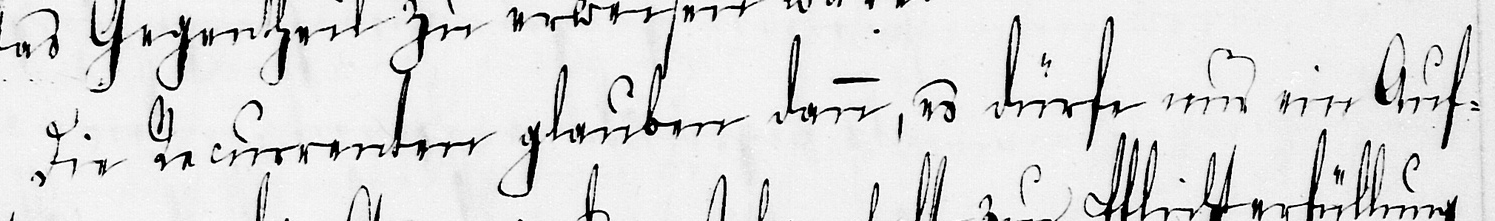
Die Recurrenten glauben dann, es dürfe nur ein Auf¬
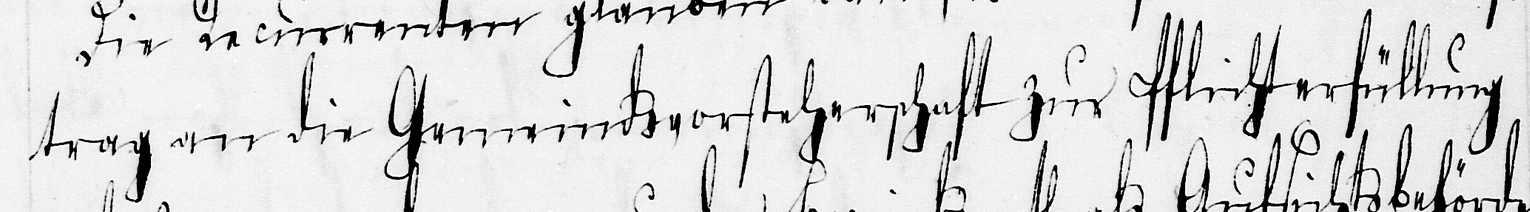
trag an die Gemeindsvorsteherschaft zur Pflichterfüllung
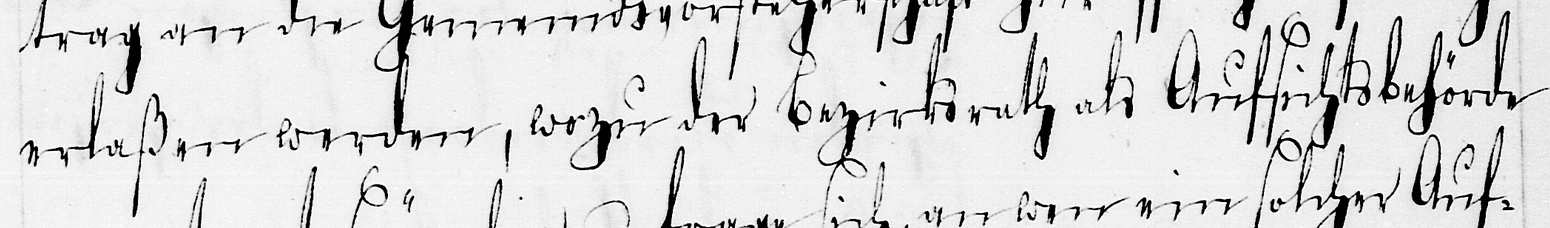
erlaßen werden, wozu der Bezirksrath als Aufsichtsbehörde
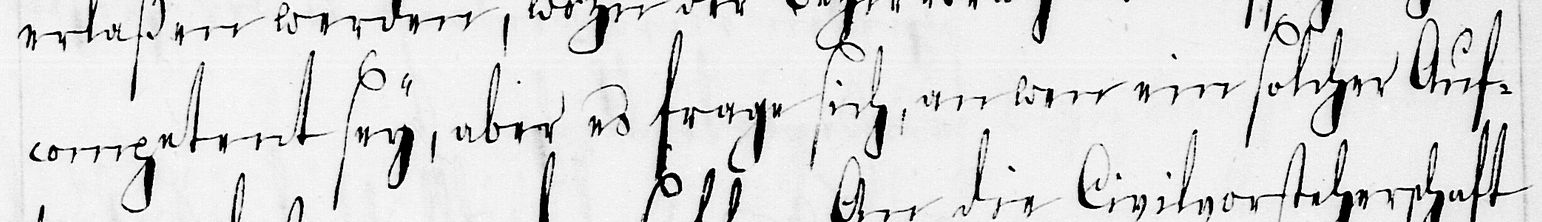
competent sey, aber es frage sich, an wen ein solcher Auf¬
